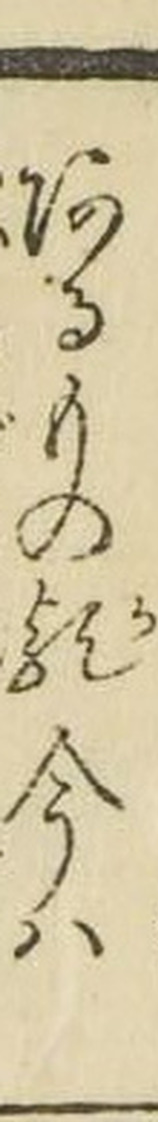あるもの欤今は
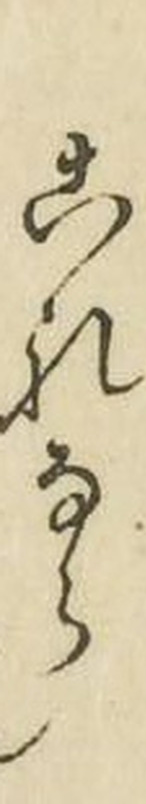これならん
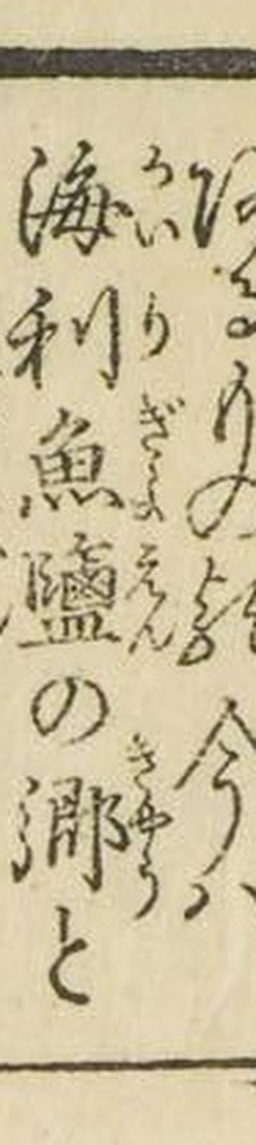海利魚鹽の郷と
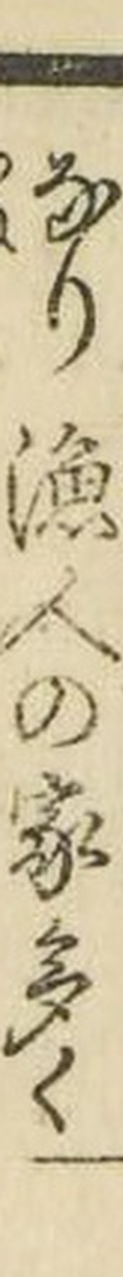なり漁人の家多く
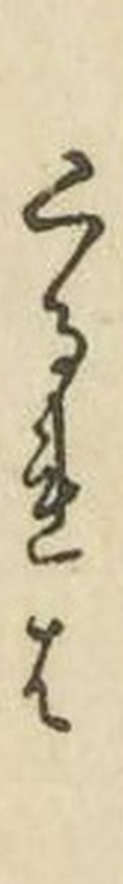くるれは
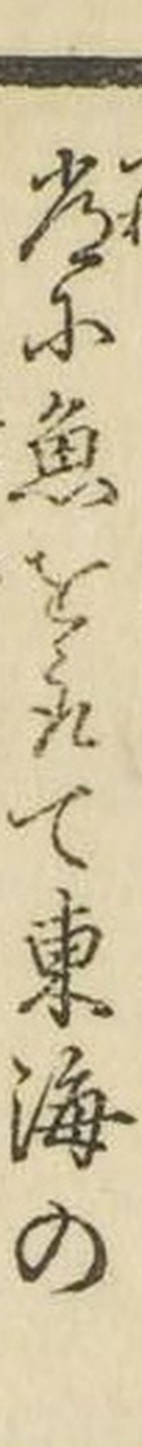常に魚を取て東海の
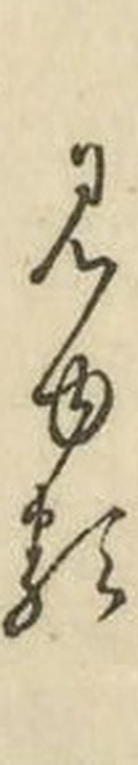見ゆる
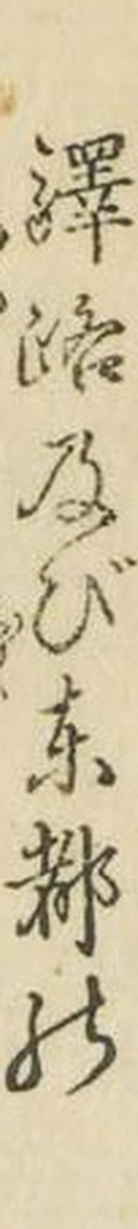驛路及び東都の
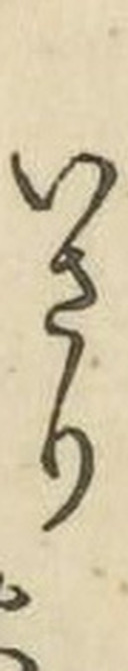いさり
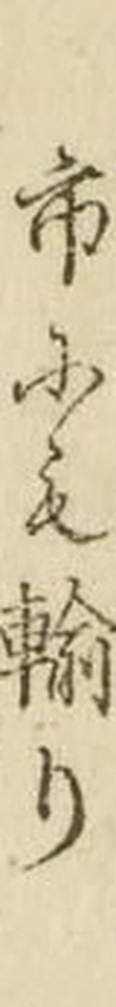市にも輸り
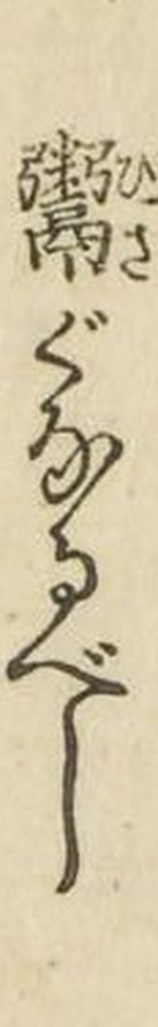鬻ぐなるべし
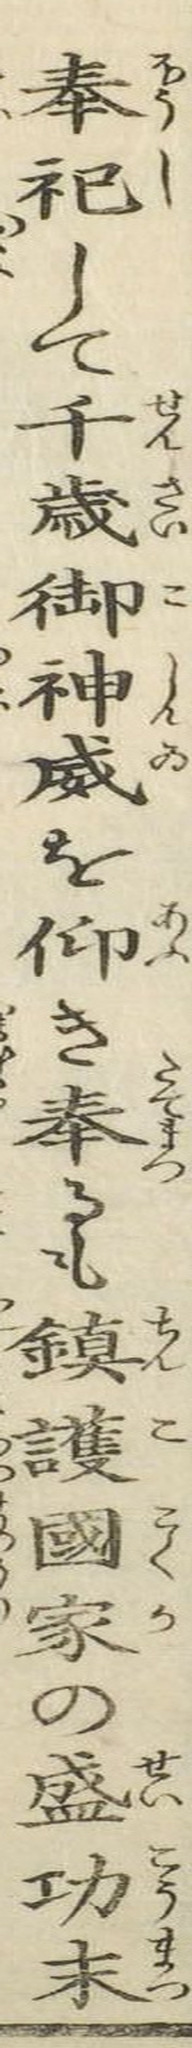奉祀して千歳御神威を仰き奉るも鎮護國家の盛功末
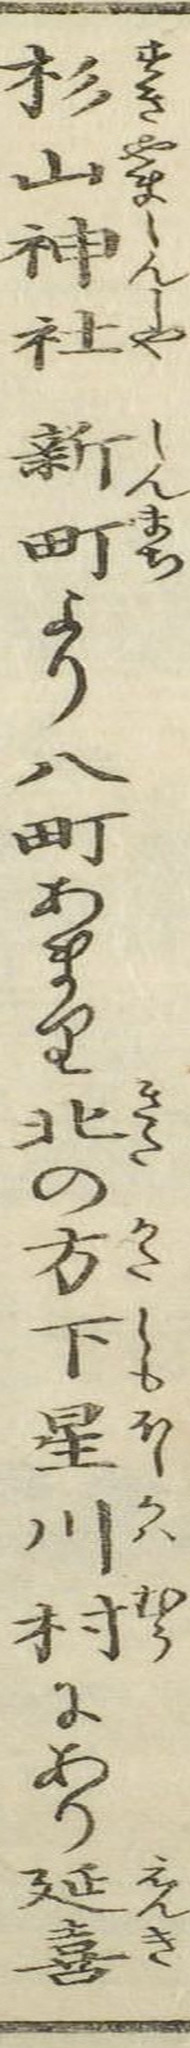杉山神社新町より八町あまり北の方下星川村にあり延喜
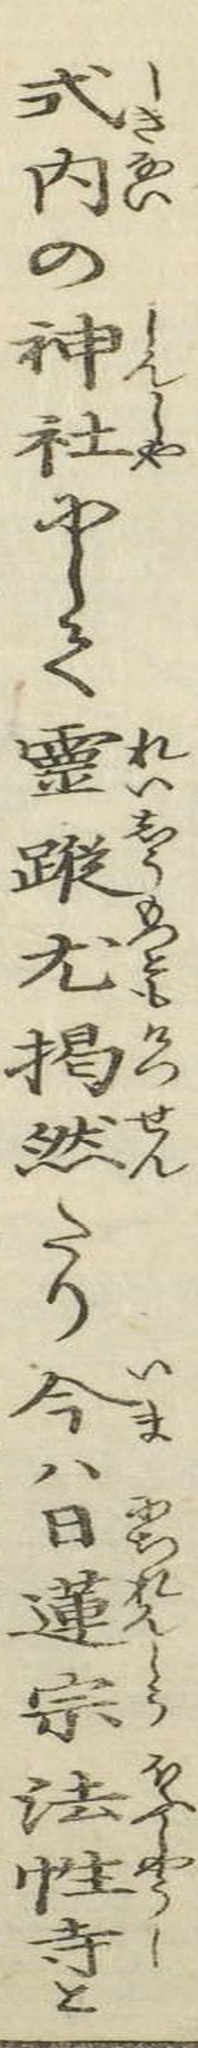式内の神社にして靈蹤尤掲然たり今は日蓮宗法性寺と
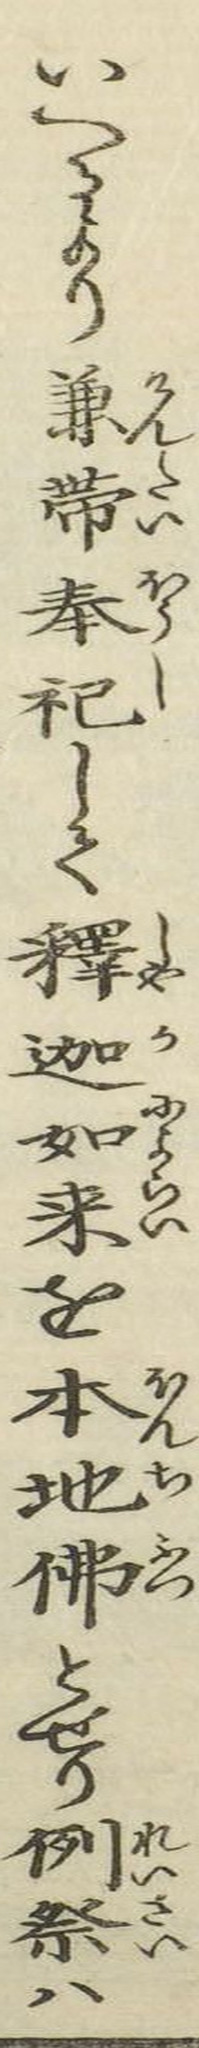いへるより兼帯奉祀して釋迦如来を本地佛とせり例祭は
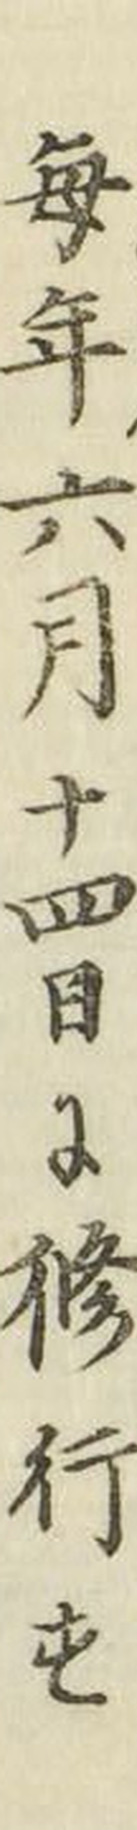毎年六月十四日に修行す
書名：江戸名所図会 20巻 巻之6
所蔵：東京学芸大学教育コンテンツアーカイブ
